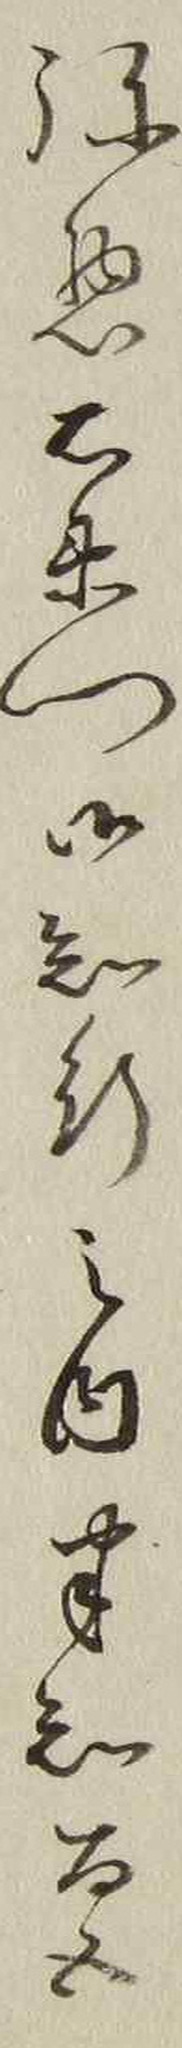弥惣右衛門御知行之内半知百五
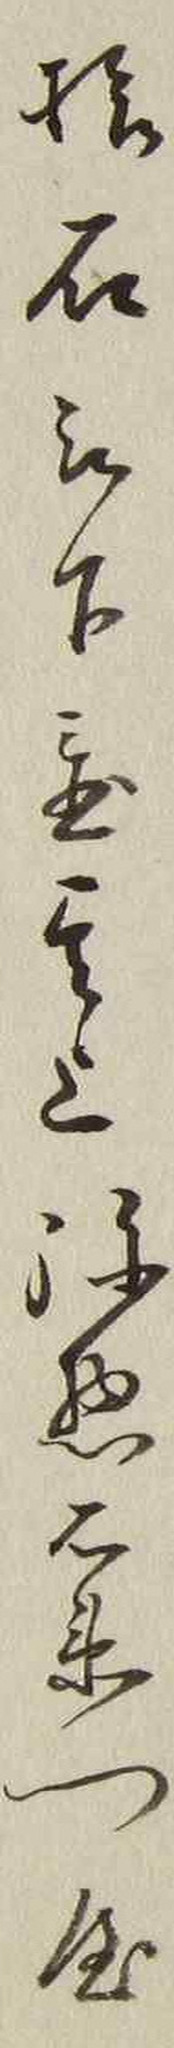拾石被下置其上弥惣右衛門屋
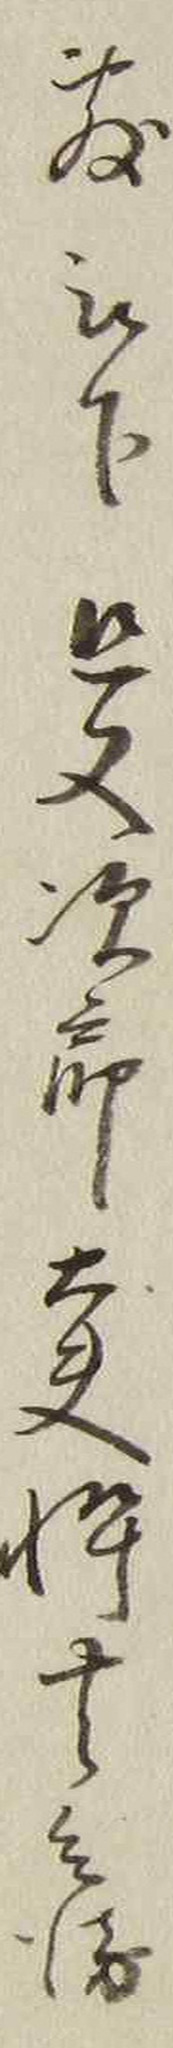敷被下旦又次郎太夫忰十兵衛
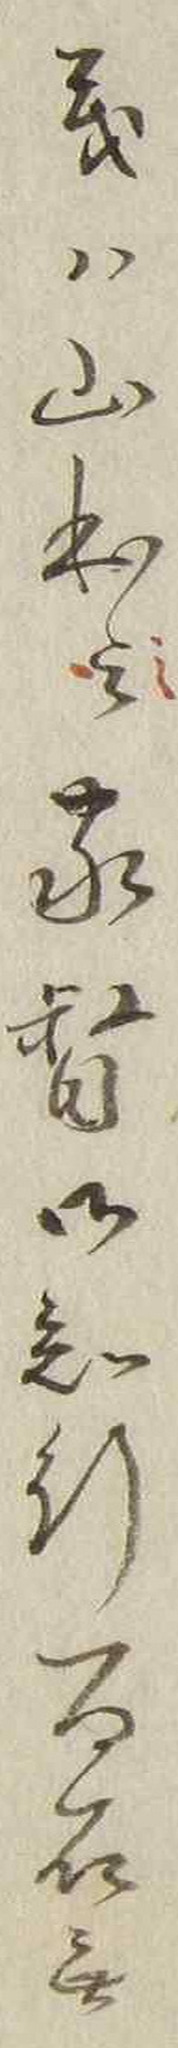義は山本之家督御知行百石無

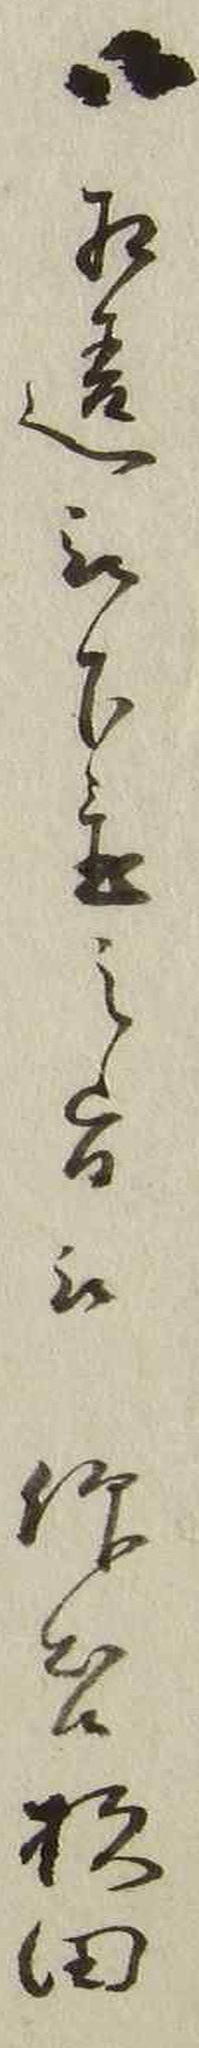御相違被下置之旨被仰出候杉田
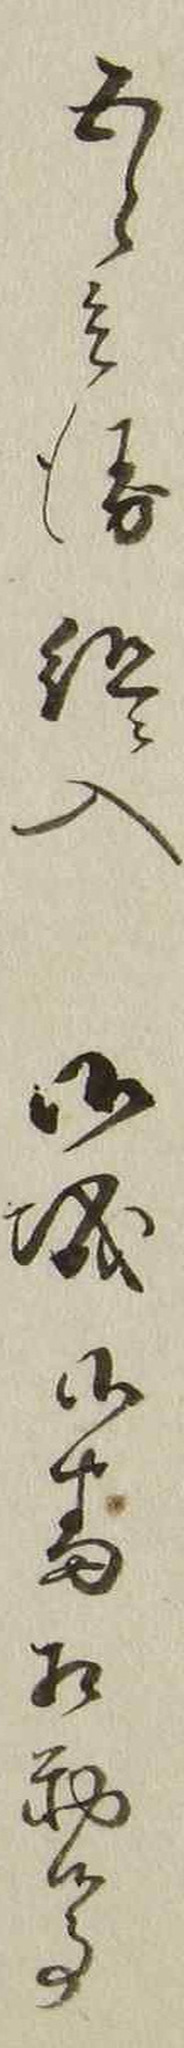五郎兵衛組に入御城御番相勤候事
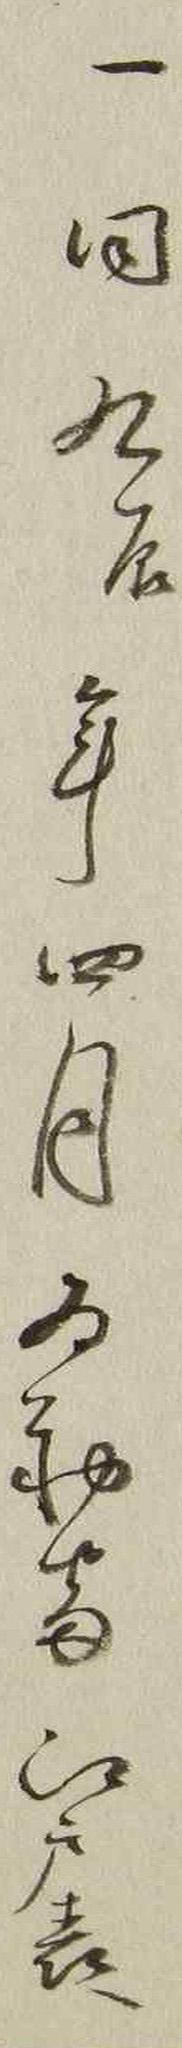一同九辰年四月為勤番江戸表へ
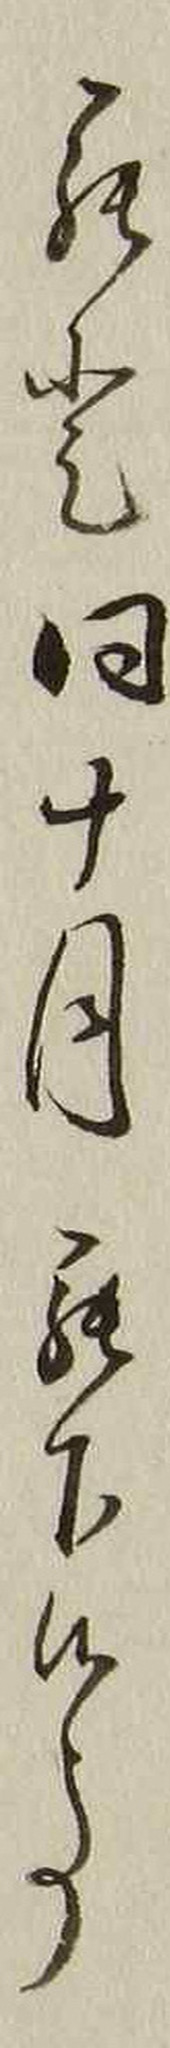罷登同十月罷下候事
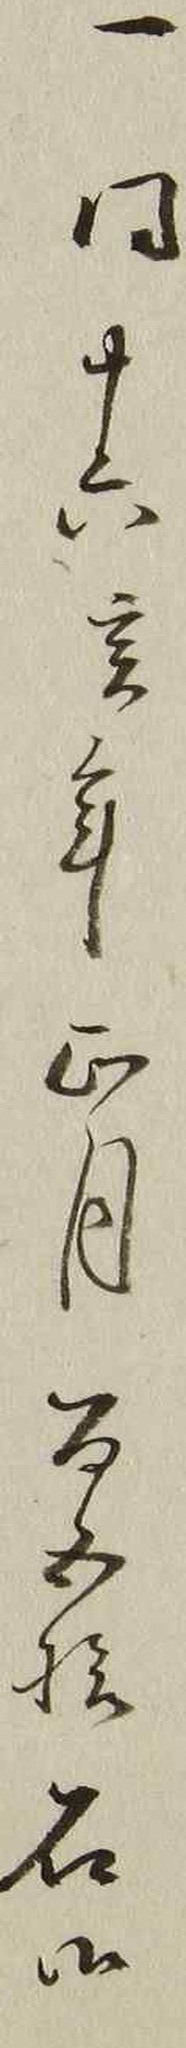一同十六亥年正月百五拾石御
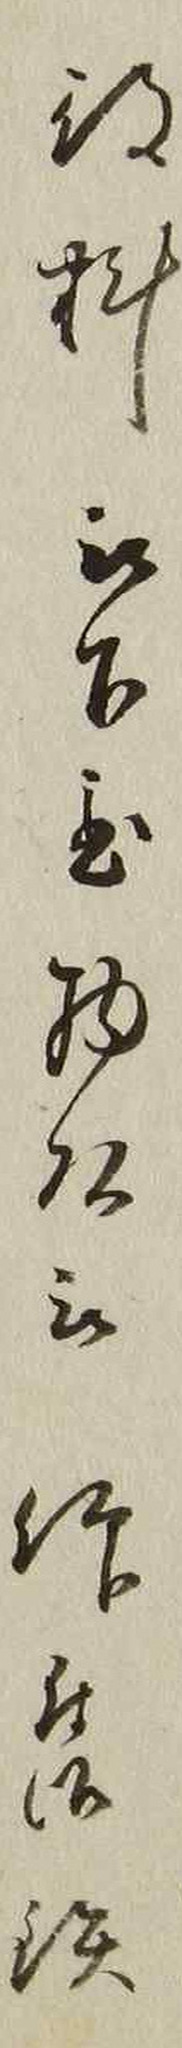役料被下置物頭被仰付御鉄
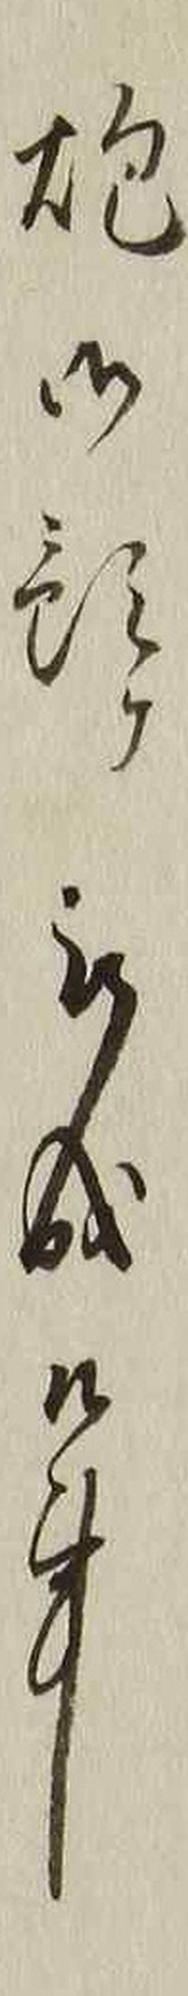炮御預け被成候事
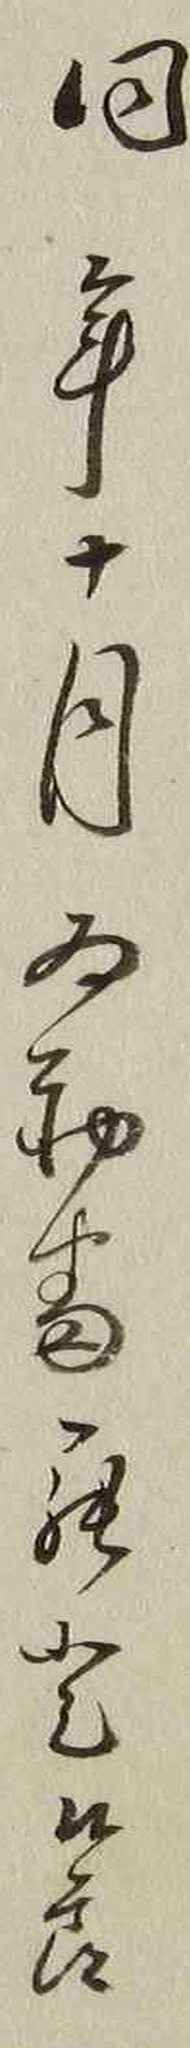一同年十月為勤番罷登候節
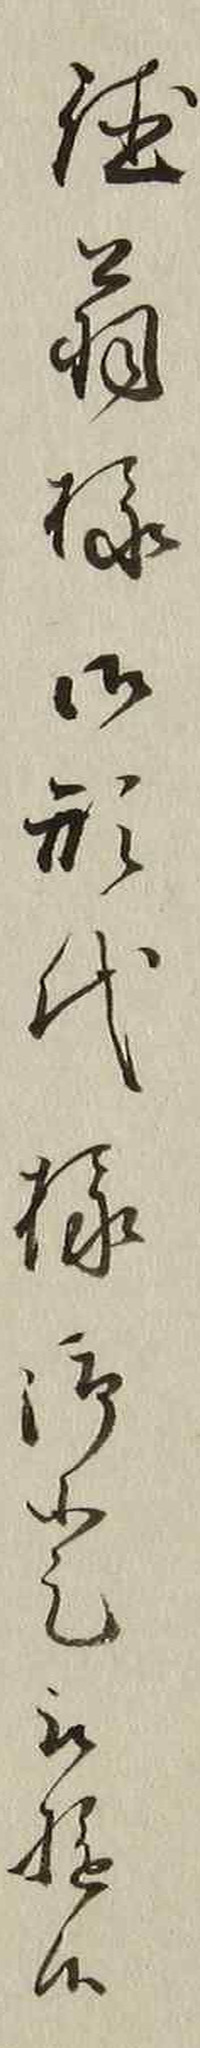徳翁様御形代様御登被遊候
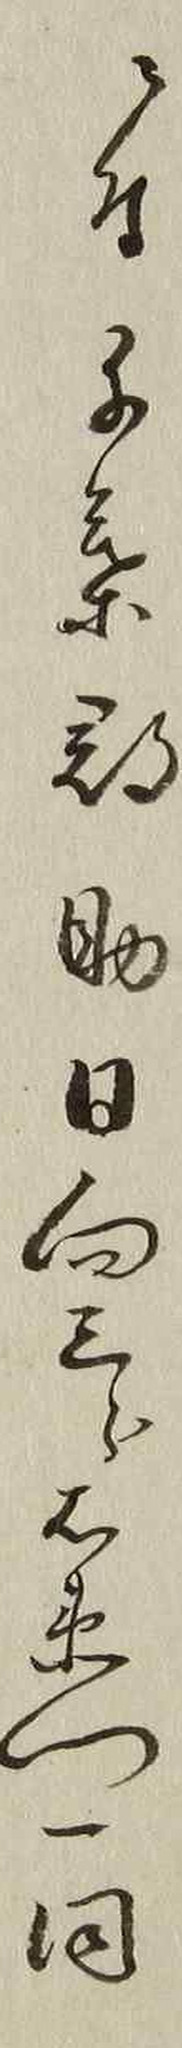に付千葉郡助日向三郎右衛門一同
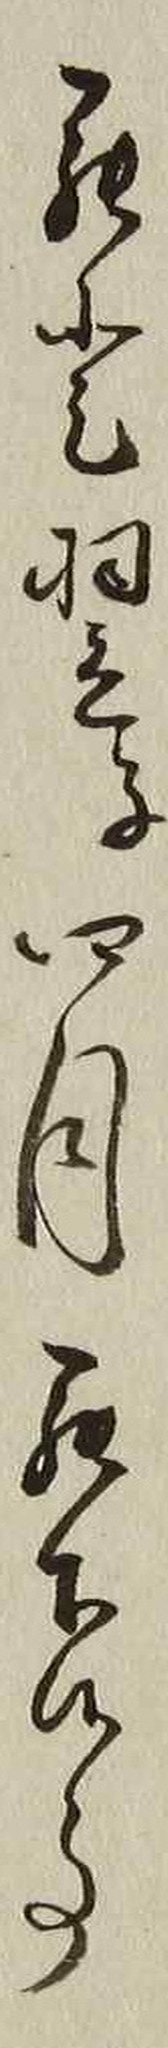罷登翌子四月罷下候事
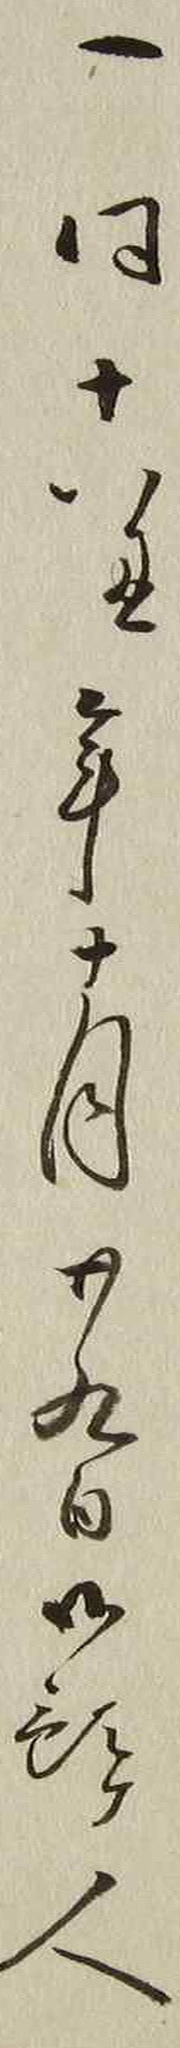一同十八丑年十月廿九日御預り人
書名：諸士系譜　巻之159　な之部1
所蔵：会津若松市立会津図書館
